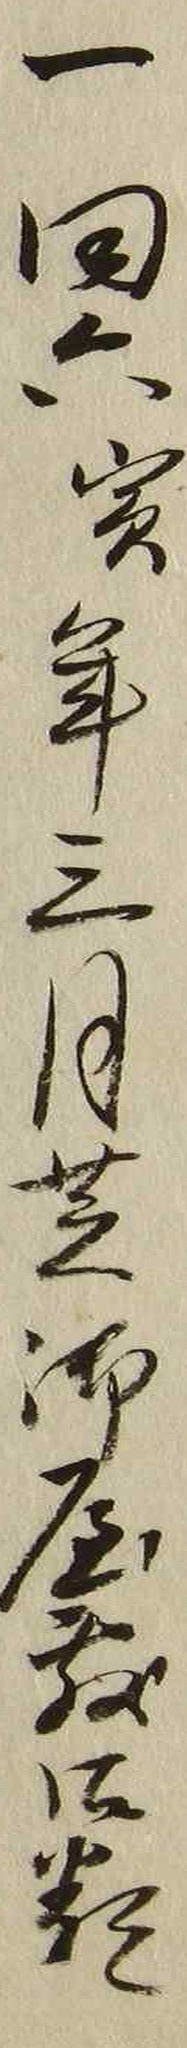一同六寅年三月芝御屋敷御類
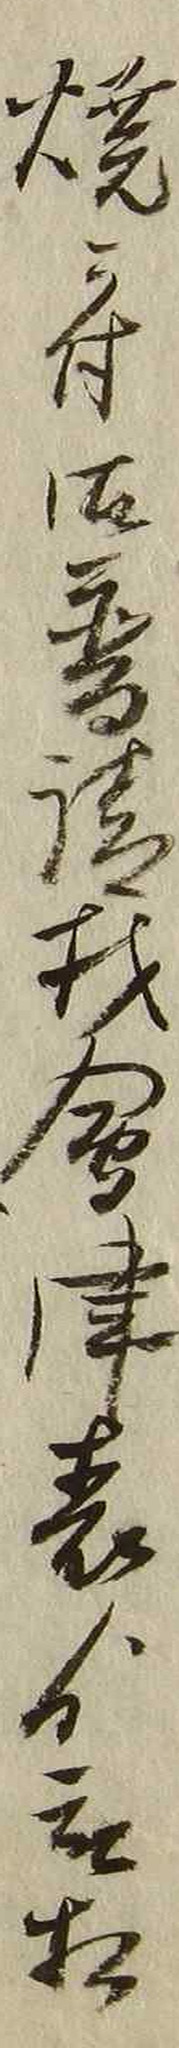焼ニ付御普請材会津表ゟ被相
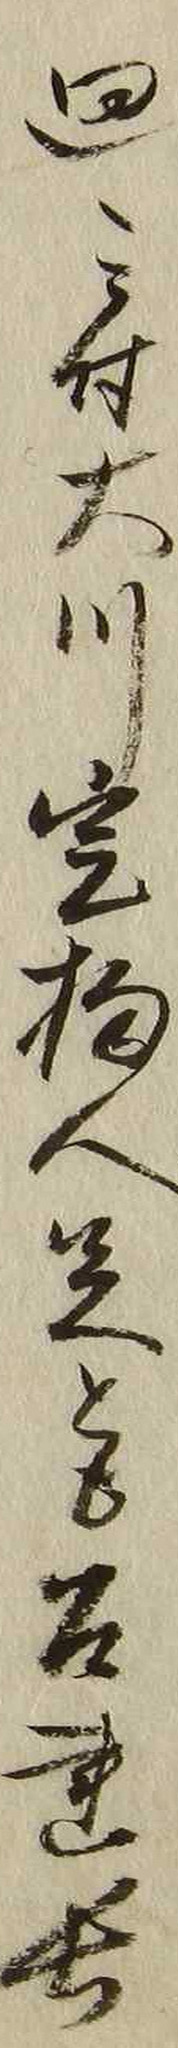廻候ニ付大川定抱人足とも召連長
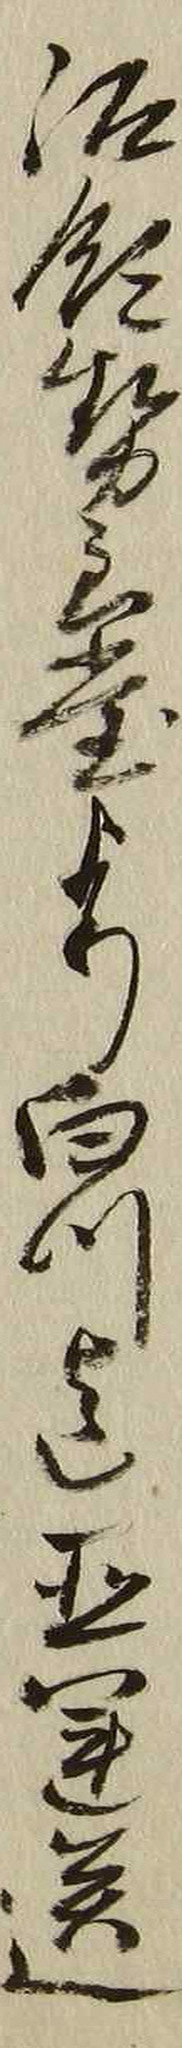沼領勢至堂より白川迄直運送
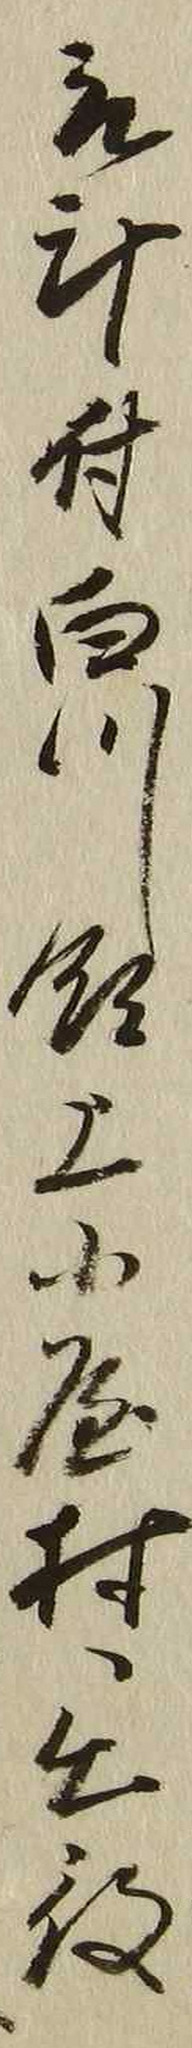取計付白川領上小屋村へ出役
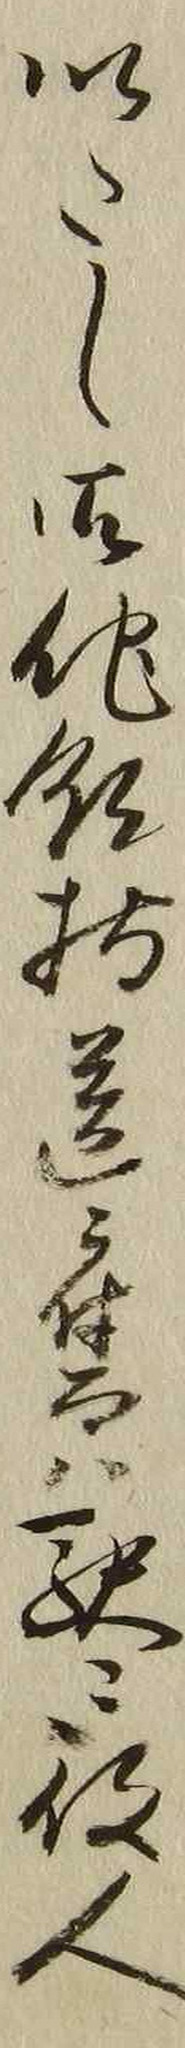いたし御他領持送ニ付而ハ駅々役人
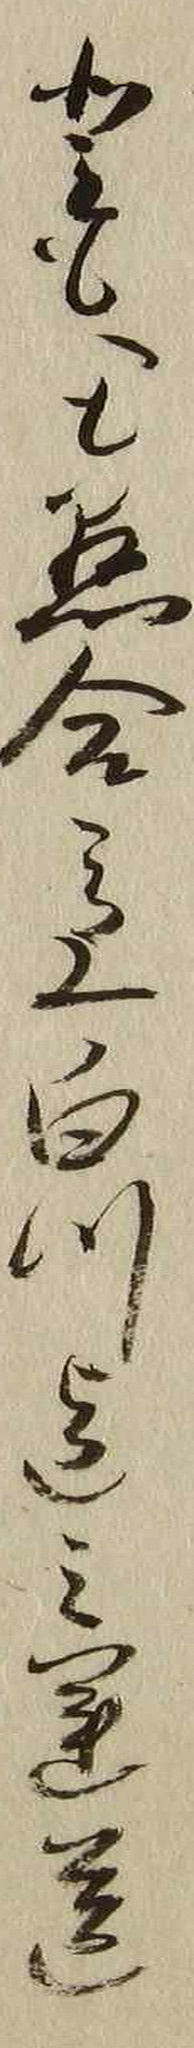ともへも懸合之上白川迄之運送
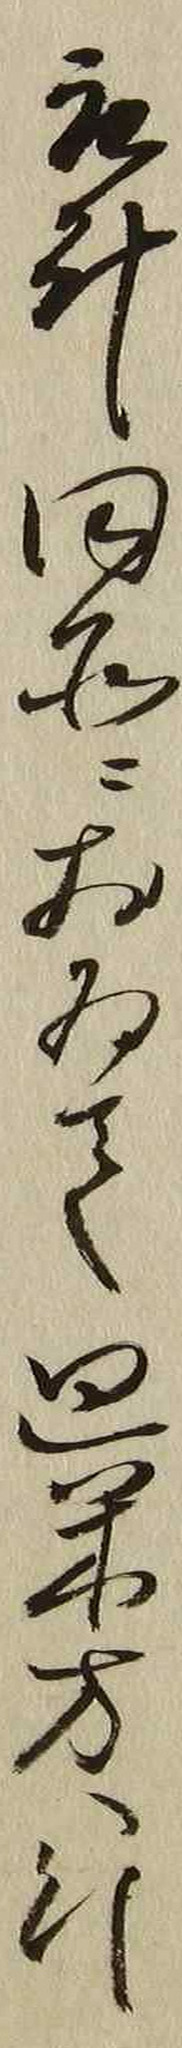取計同所ニおゐて廻米方へ引
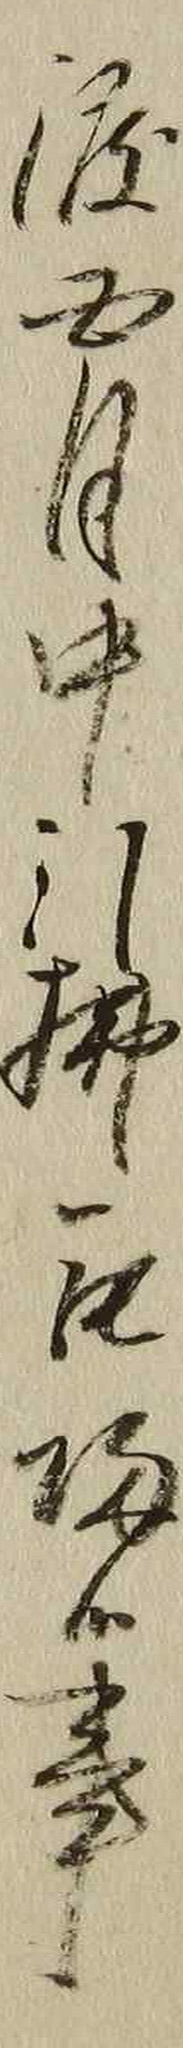渡五月中引払罷帰候事
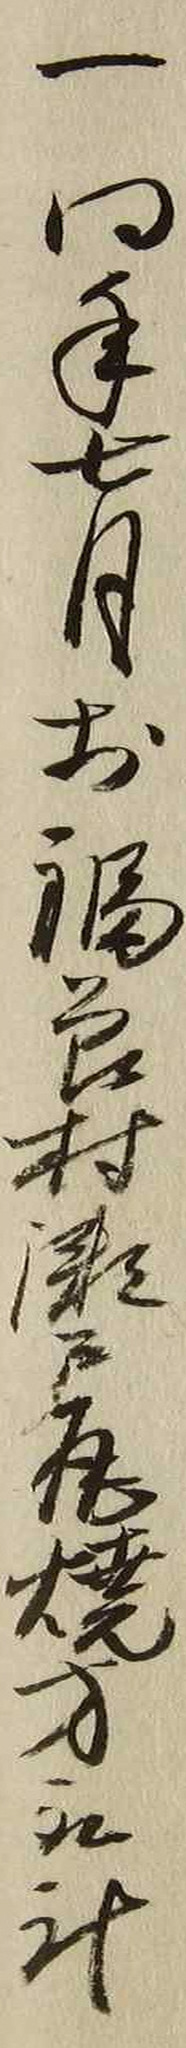一同年七月於福良村瀬戸瓦焼方取計
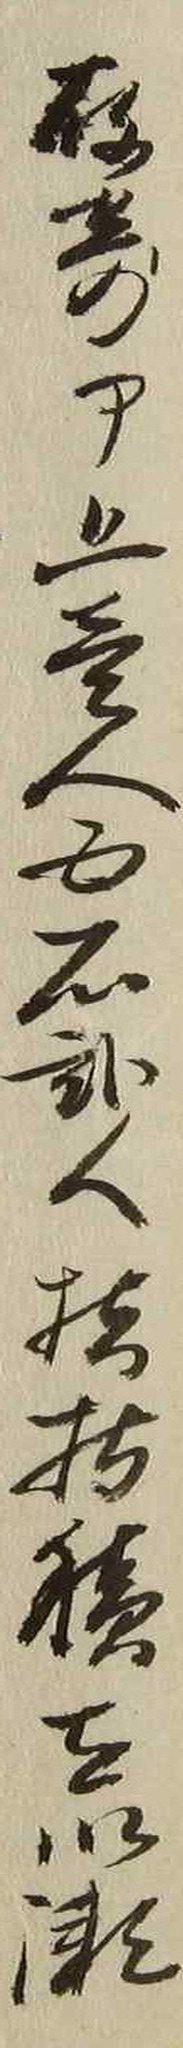存寄申上壱人五石弐人扶持積を以瀬
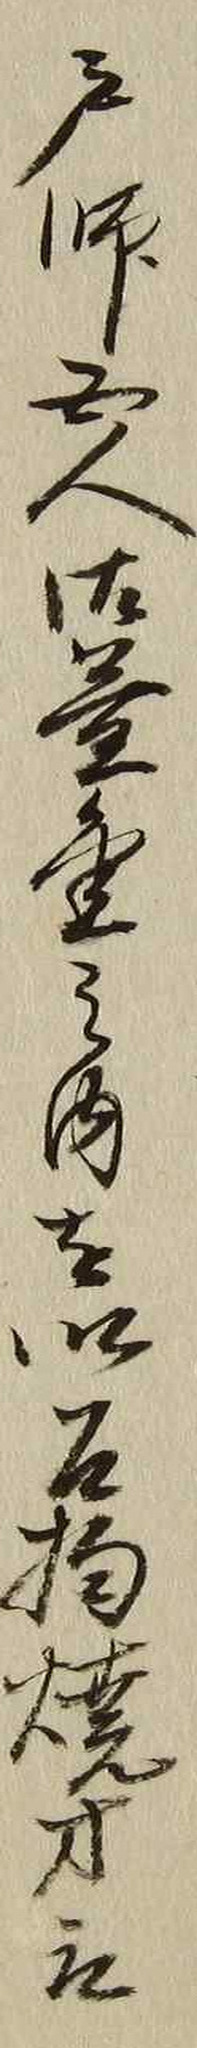戸師五人御益金之内を以召抱焼方取
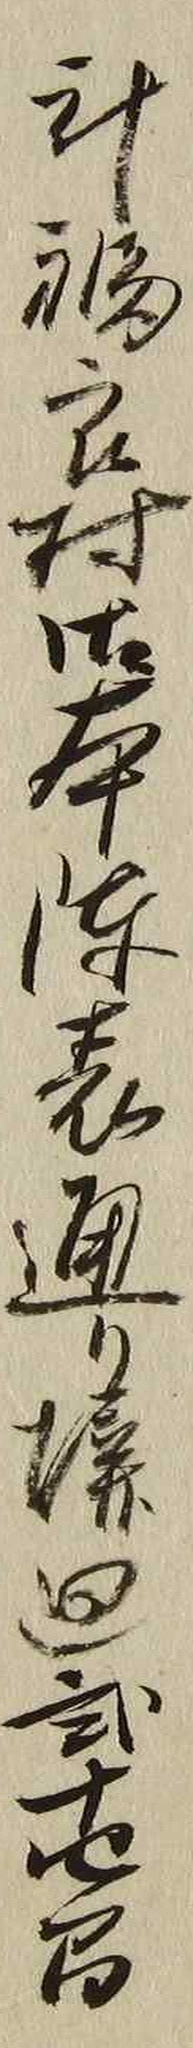計福良村御本陣表通り塀廻弐十四間
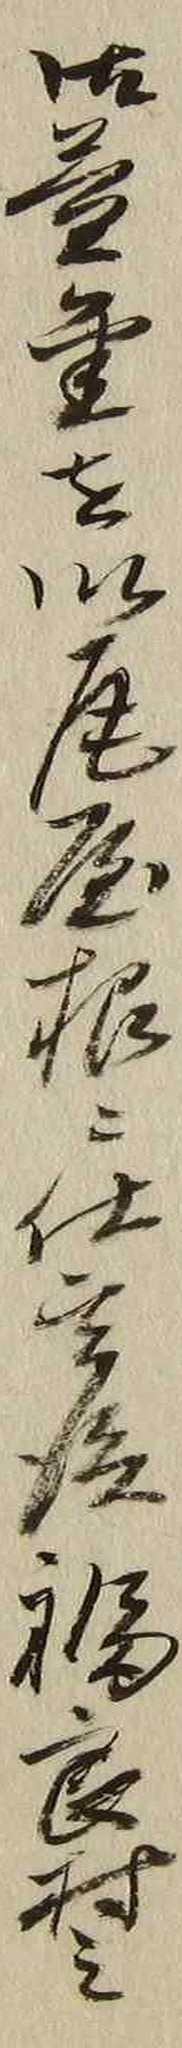御益金を以瓦屋根ニ仕其後福良村之
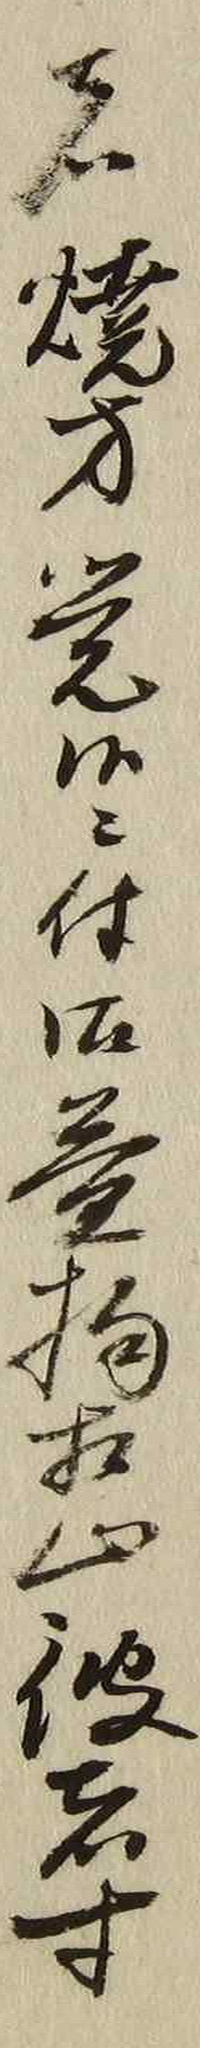者焼方覚候ニ付御益抱相止彼者寸
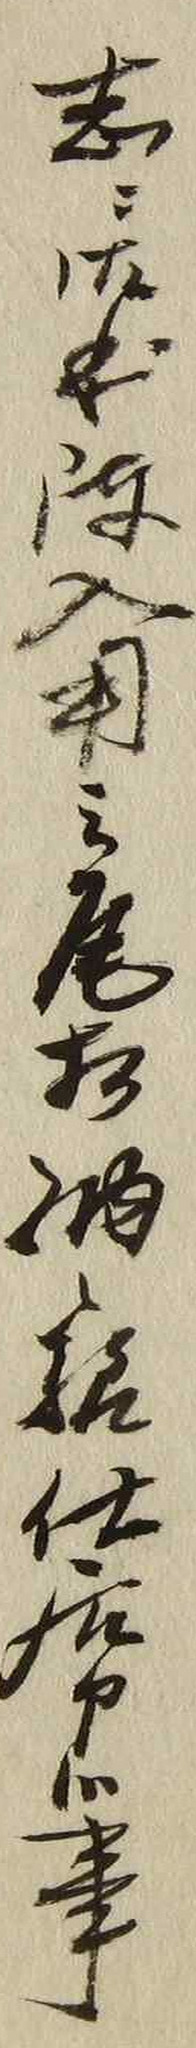志ニ御本陣入用之瓦相納候様仕居申候事
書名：諸士系譜　巻之352　す之部2
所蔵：会津若松市立会津図書館
